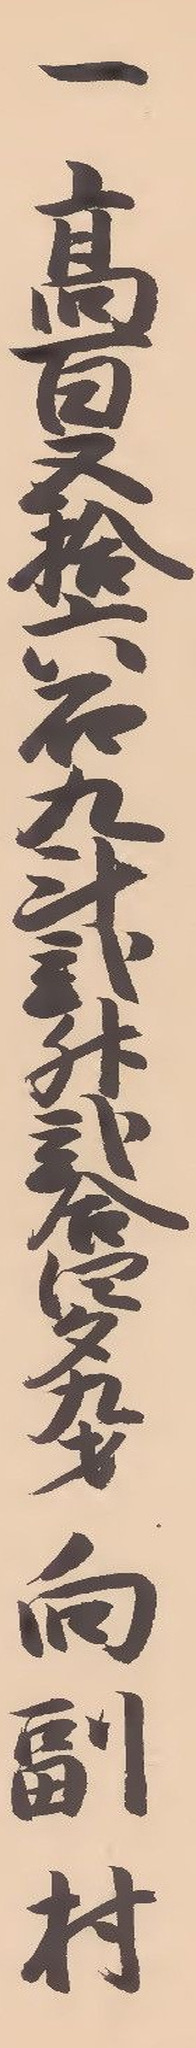一高百五拾六石九斗弐升弐合四勺九才向副村

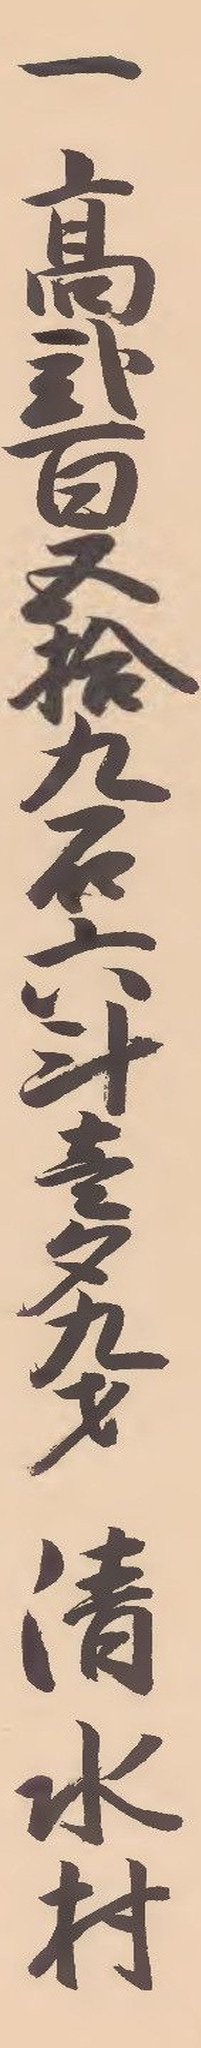一高弐百五拾九石六斗壱勺九才清水村
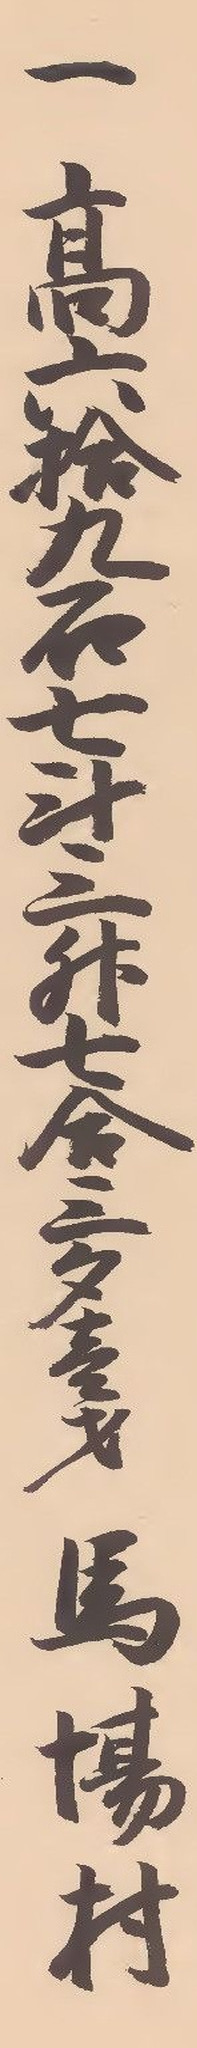一高六拾九石七斗三升七合三勺壱才馬場村
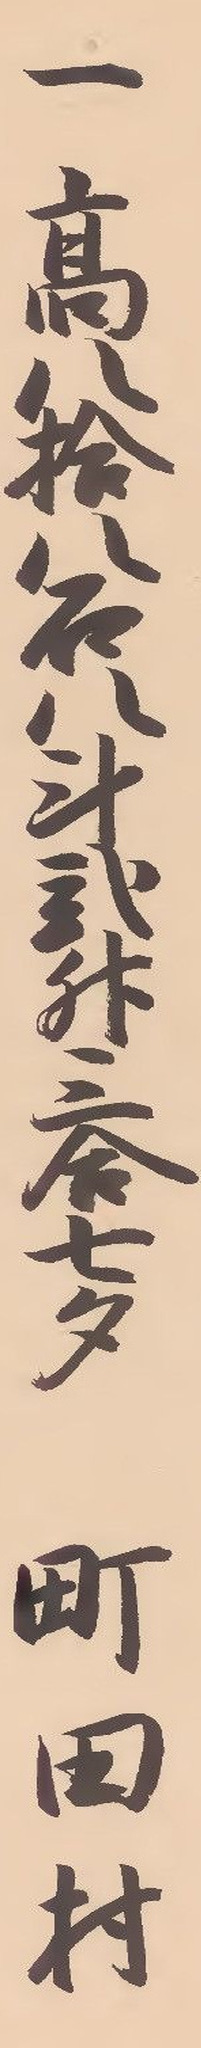一高八拾八石八斗弐升三合七勺町田村
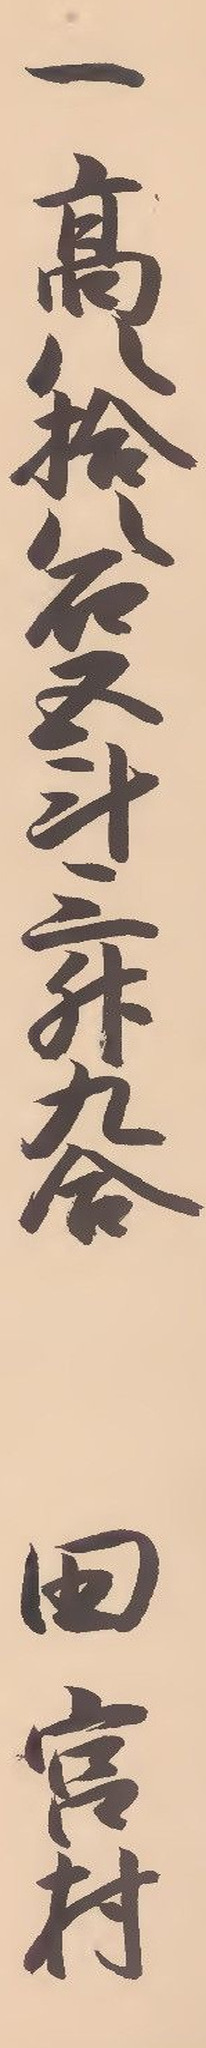一高八拾八石五斗三升九合田宮村
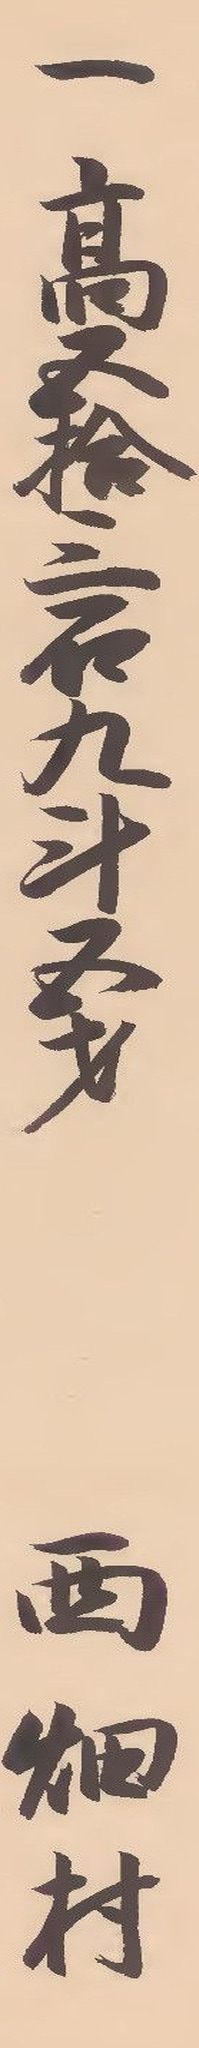一高五拾三石九斗五才西畑村
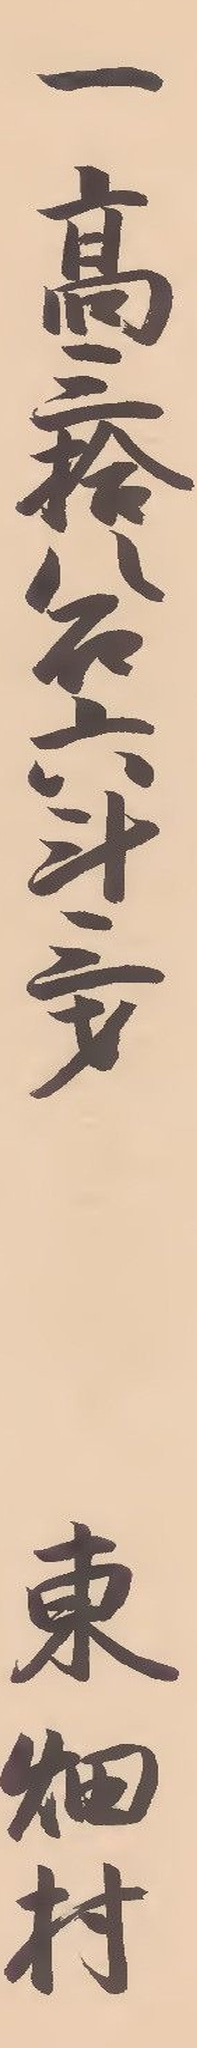一高三拾八石六斗三才東畑村
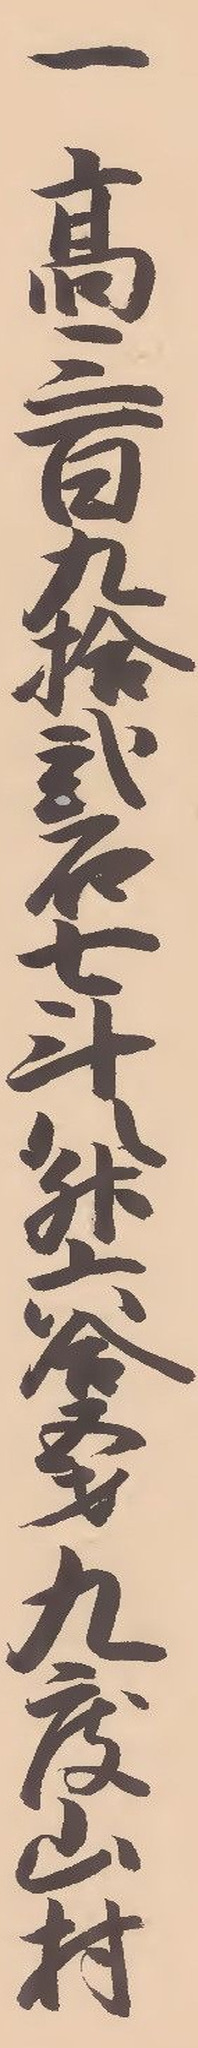一高三百九拾弐石七斗八升六合五才九度山村

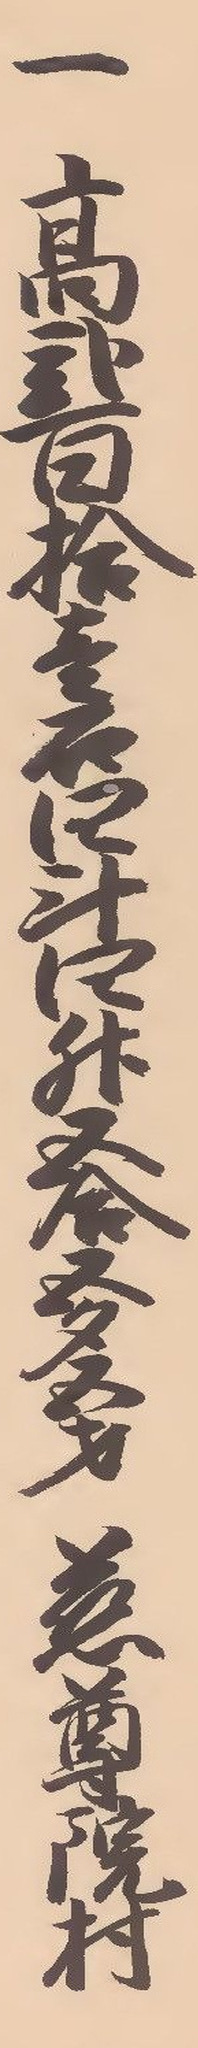一高弐百拾壱石四斗四升五合五勺五才慈尊院村
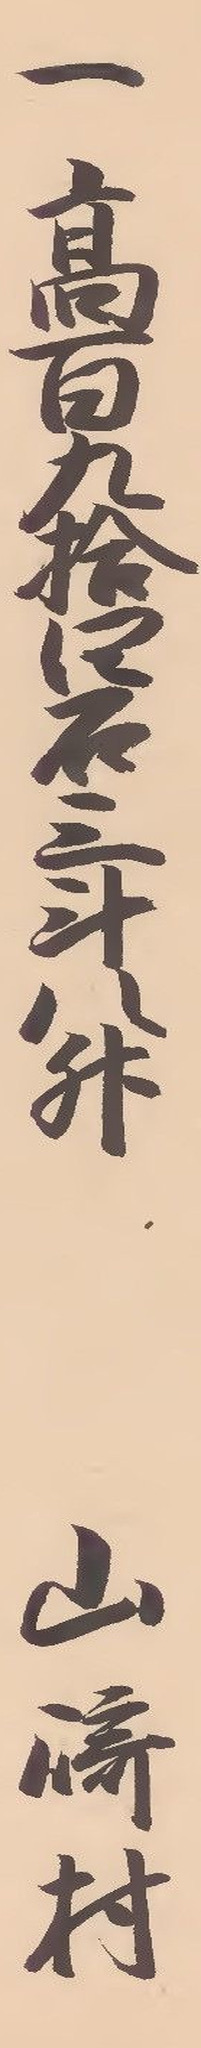一高百九拾四石三斗八升山崎村
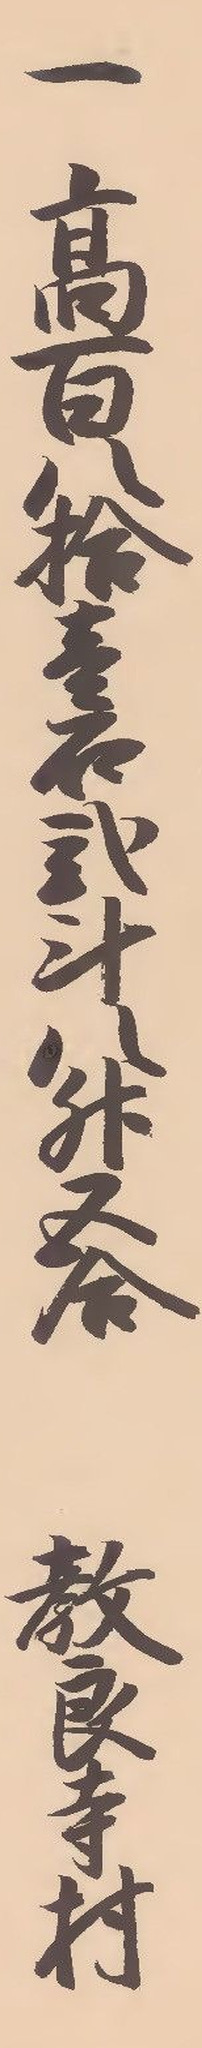一高百八拾壱石弐斗八升五合教良寺村
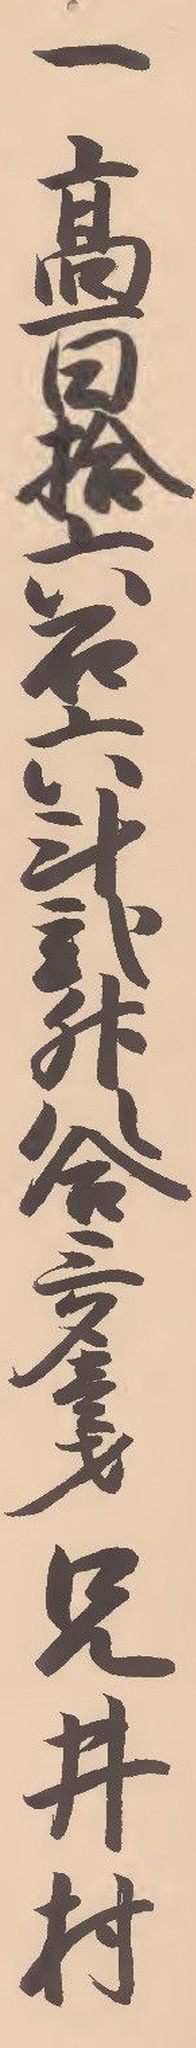一高百拾六石六斗弐升八合三尺壱才兄井村
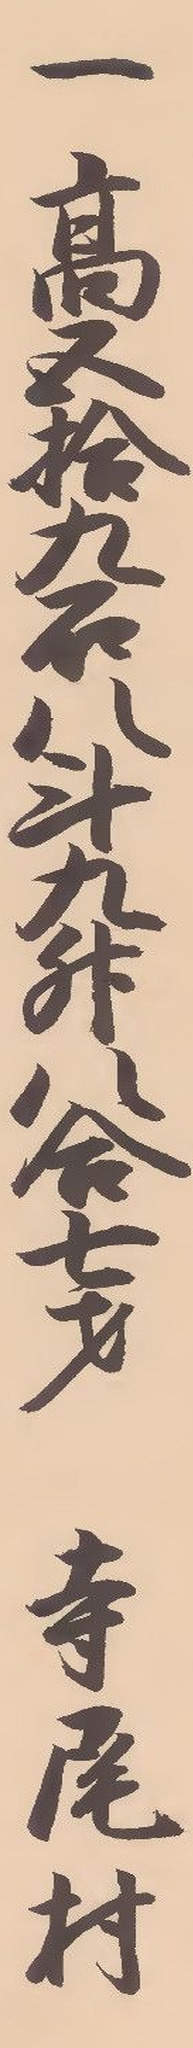一高五拾九石八斗九升八合七才寺尾村
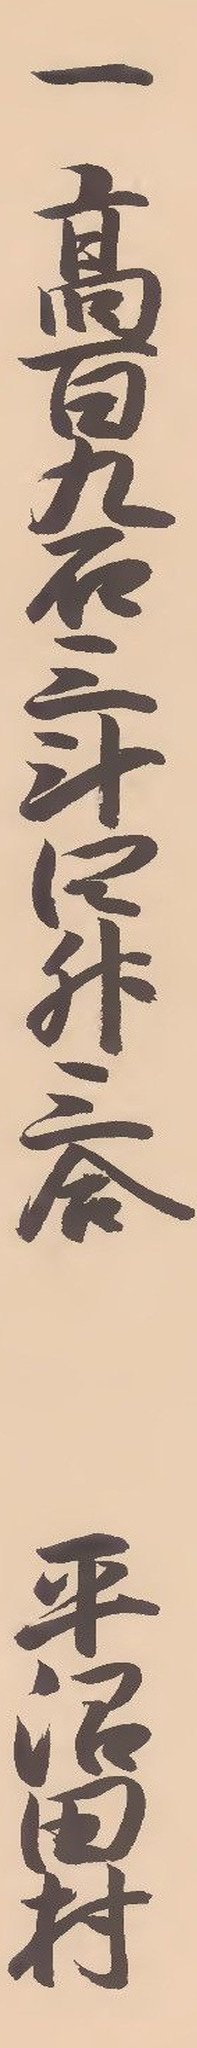一高百九石三斗四升三合平沼田村
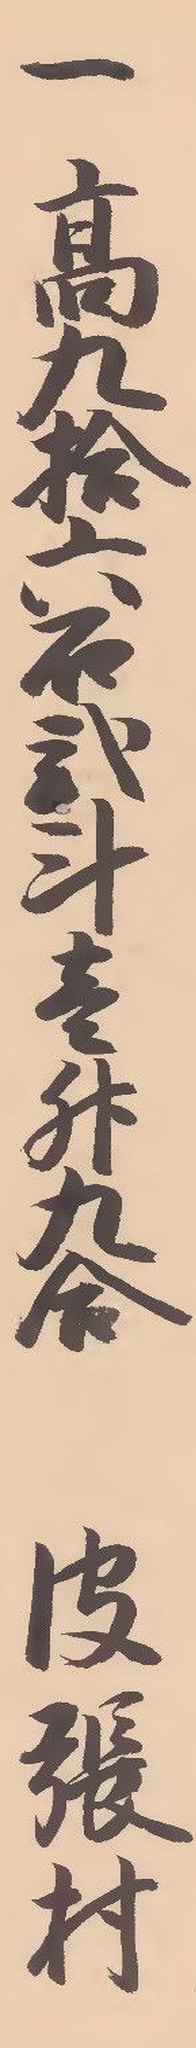一高九拾六石弐斗壱升九合皮張村

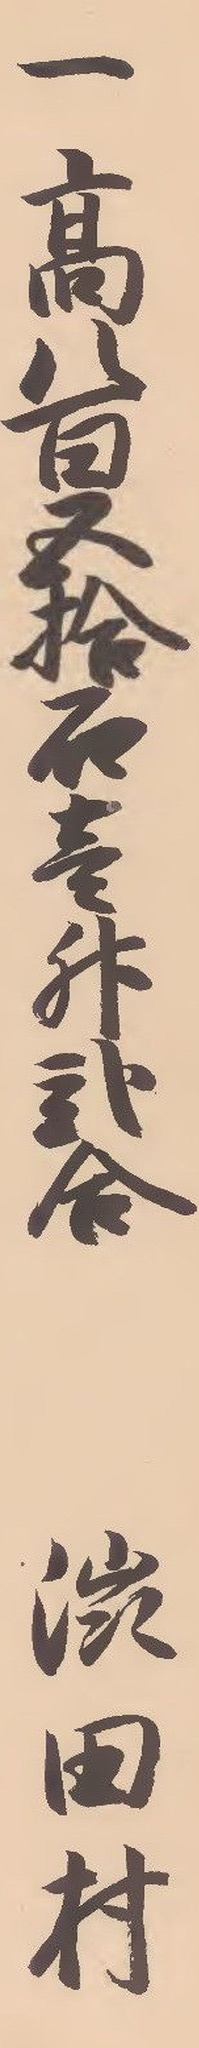一高八百五拾石壱升弐合渋田村
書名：紀伊国郷帳
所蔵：国立公文書館 National Archives of Japan
